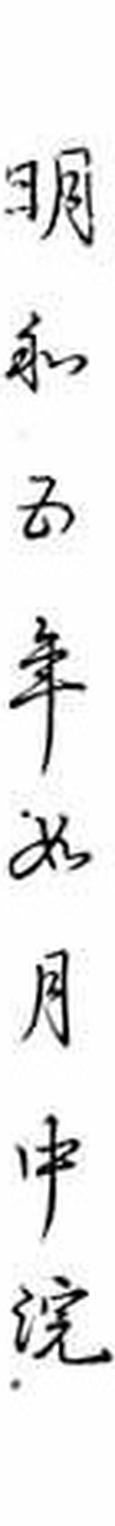明和五年如月中浣
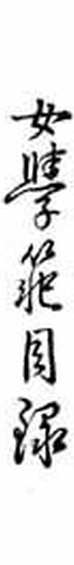女学範目録
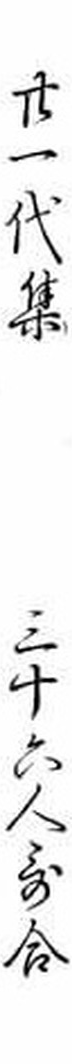廿一代集三十六人哥合

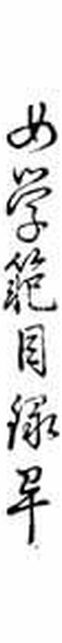女学範目録畢
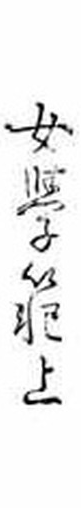女学範上
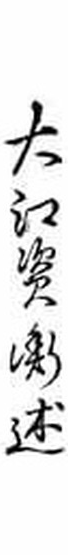大江資衡述
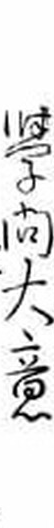学問大意
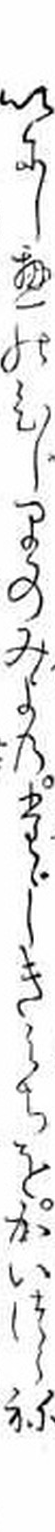いにしへのひじりのみよの。ただしきみちを。かいつらね
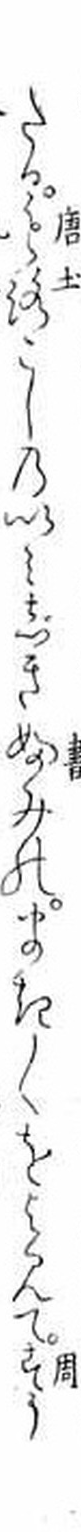たる。もろこしのいみじきふみの。まき〳〵を。よみて。すう
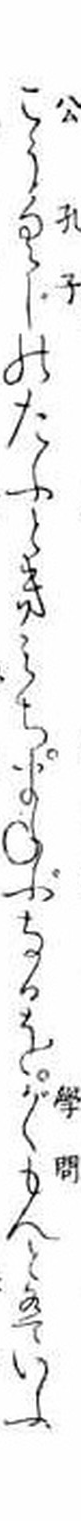こうくくじのたふときみち。まねぶなるを。がくもんとはいふ
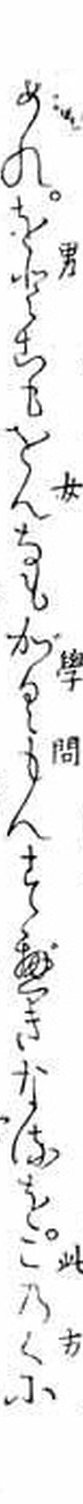めれ。をとこもをんなもがくもんすべきなるを。このくに
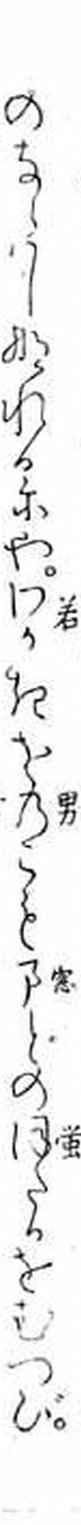のならはしなれるにやわかきをのこもまどのほたるをむつび。
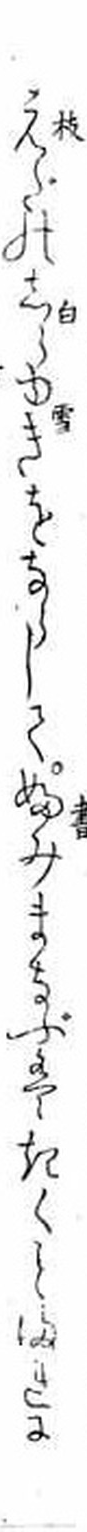えだのしらゆきをならして。ふみまなぶはきくことまれに
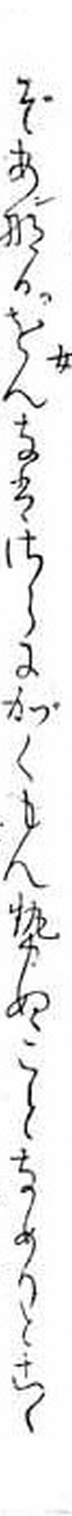ぞあなる。をんなはさらにがくもんせぬことなめりとこゝ
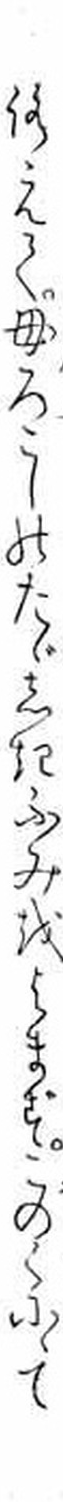ろえて。もろこしたゞしきふみをよまず。このくにゝて

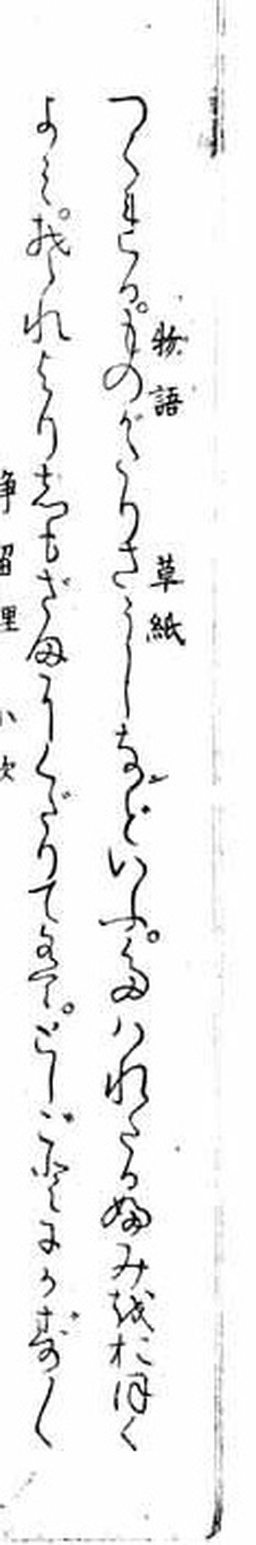つくれる。ものがたりさうしなどいふ。たはれたるふみをおほく
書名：女学範
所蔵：東京学芸大学教育コンテンツアーカイブ
